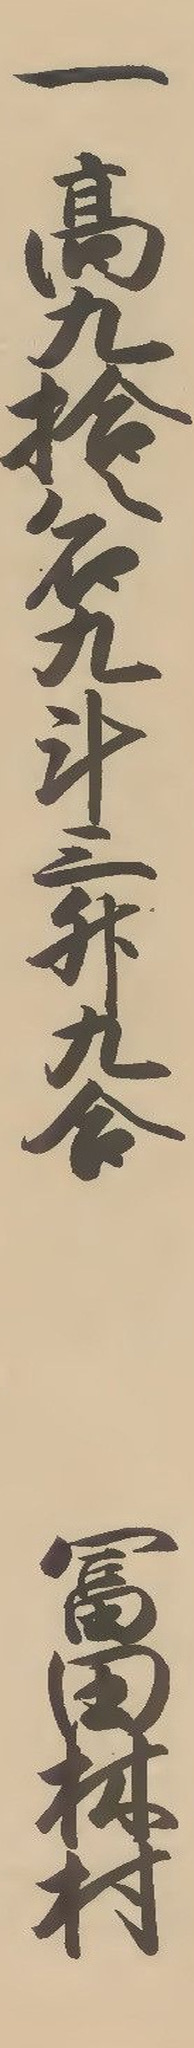一高九拾八石九斗三升九合富田林村
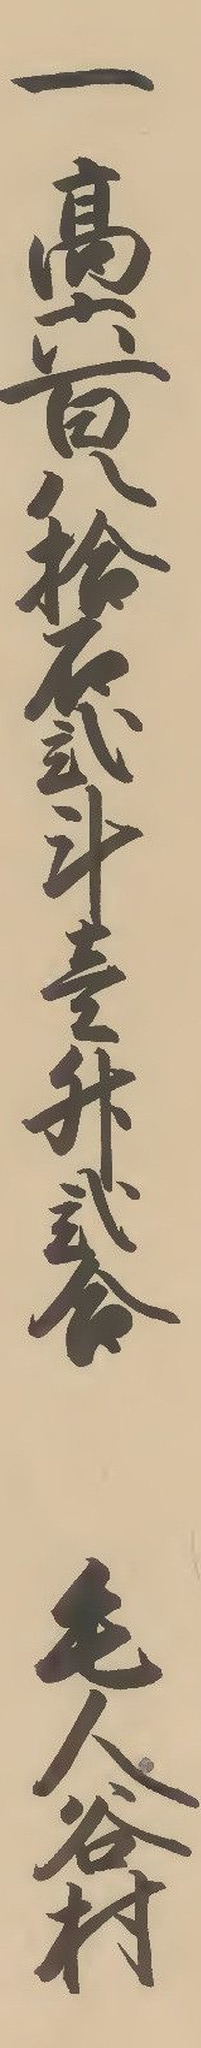一高六百八拾石弐斗壱升弐合毛人谷村
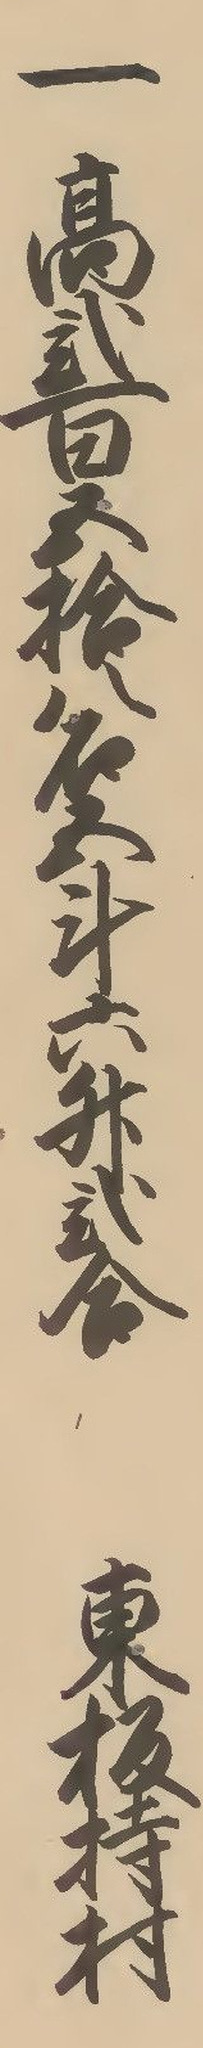一高弐百五拾八石五斗六升弐合東板持村

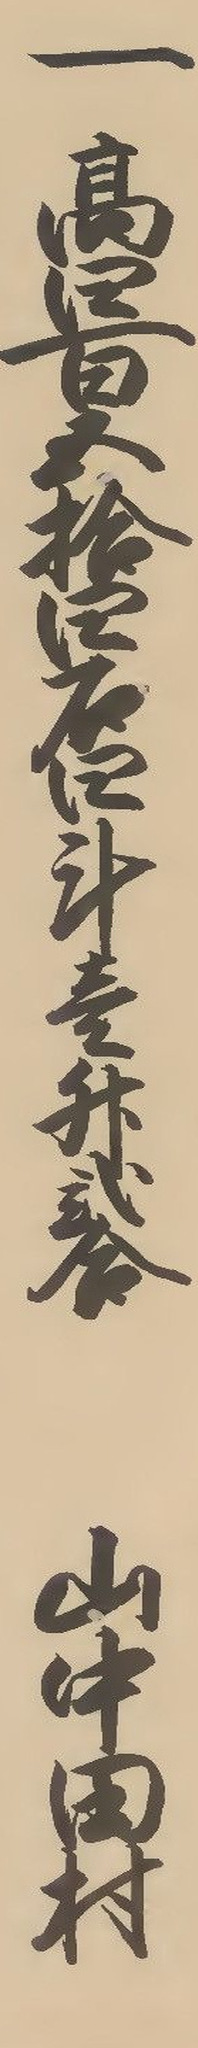一高四百五拾四石四斗壱升弐合山中田村
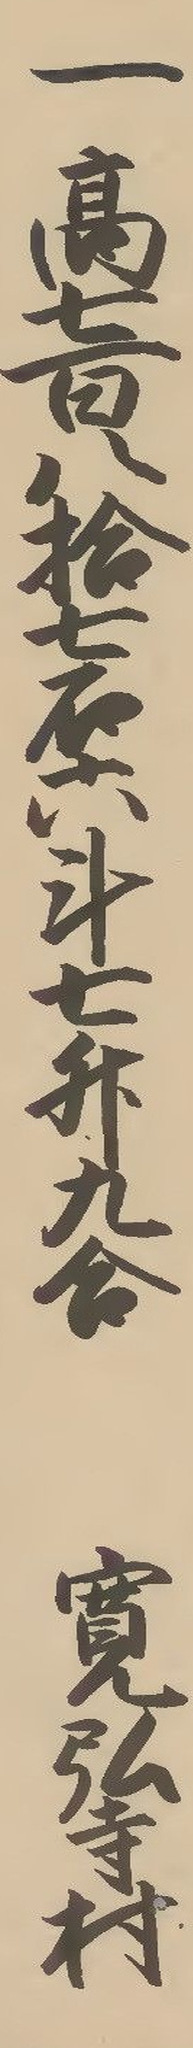一高七百八拾七石六斗七升九合寛弘寺村
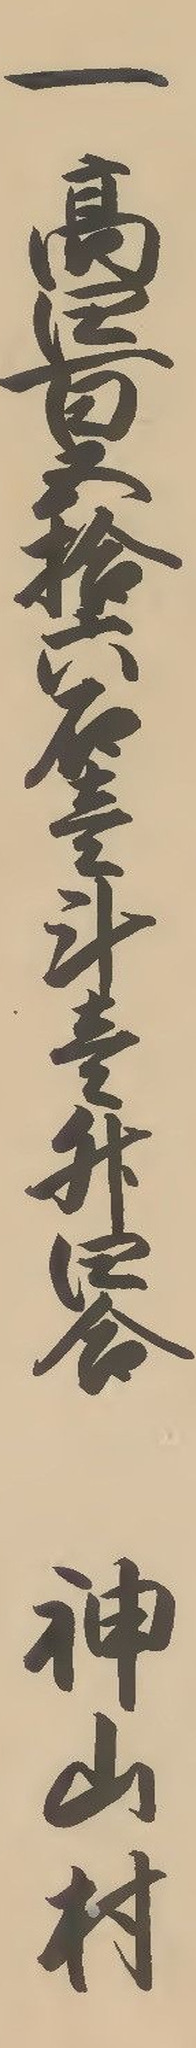一高四百五拾六石壱斗壱升四合神山村
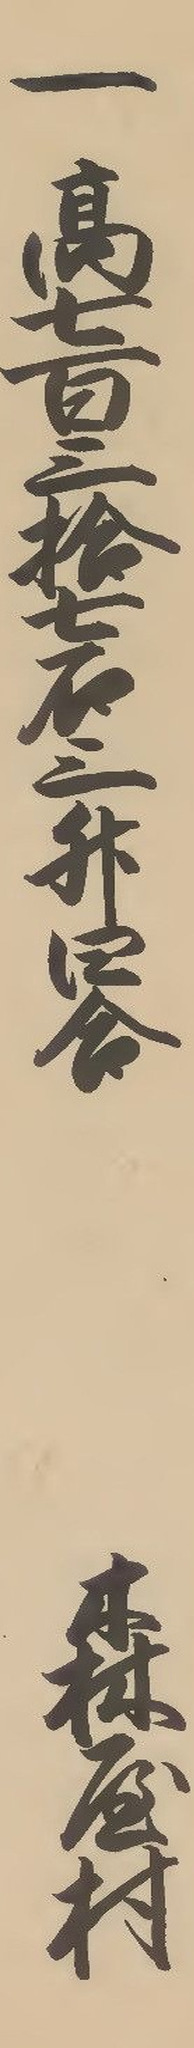一高七百三拾七石三升四合森屋村
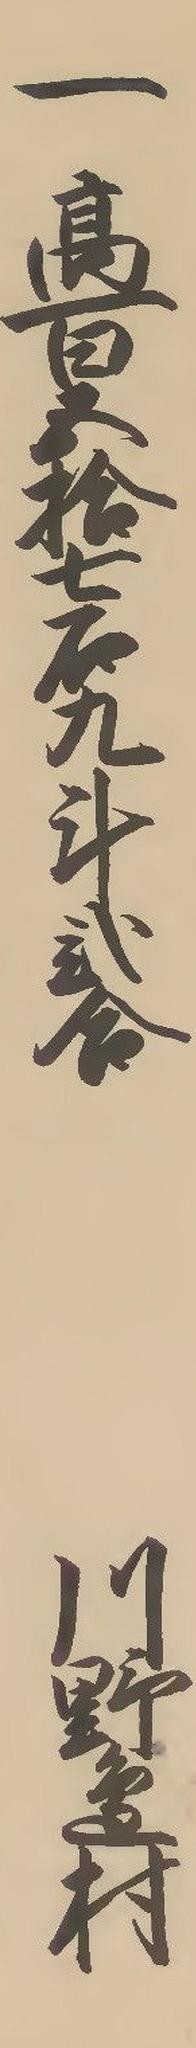一高百五拾七石九斗弐合川野辺村
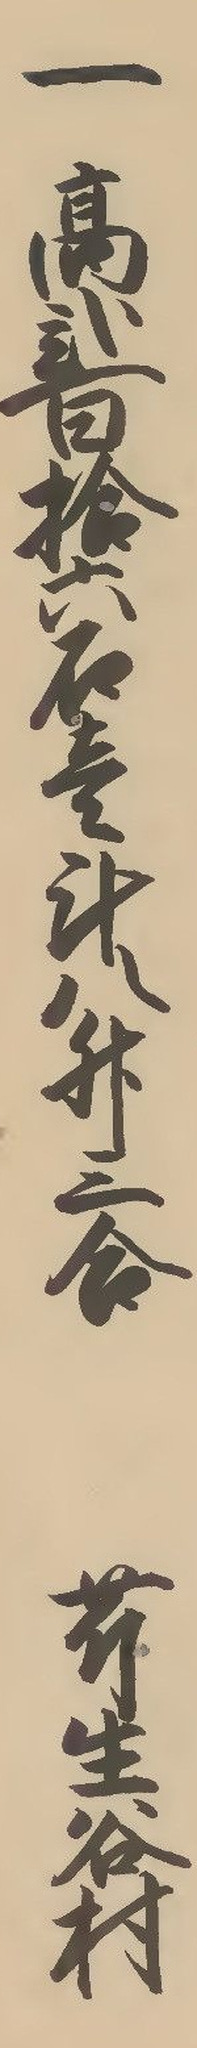一高弐百拾六石壱斗八升三合芹生谷村

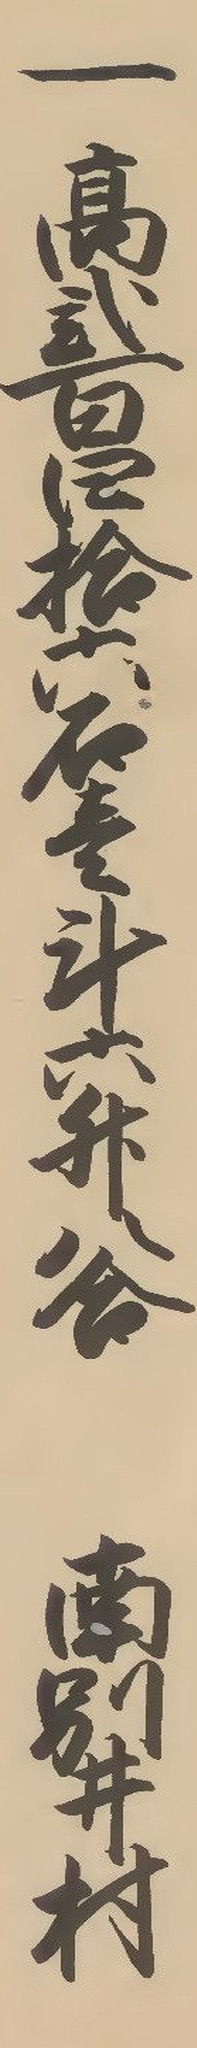一高弐百四拾六石壱斗六升八合南別井村
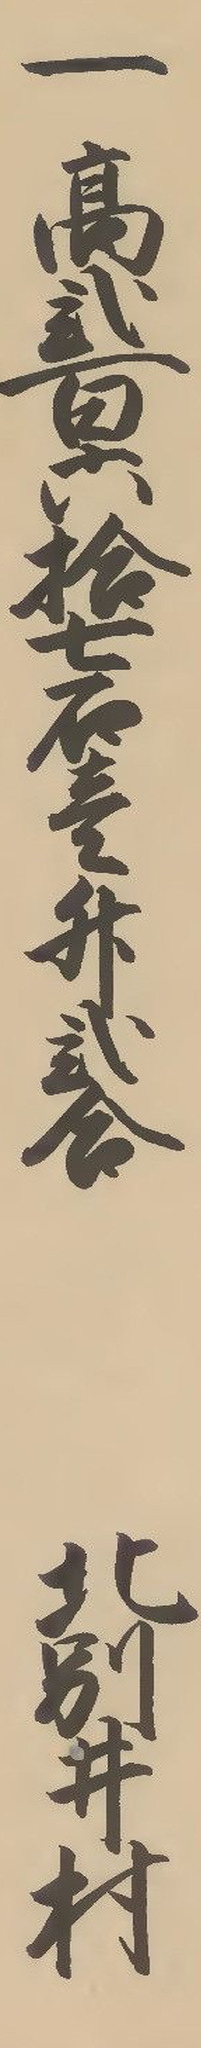一高弐百六拾七石壱升弐合北別井村
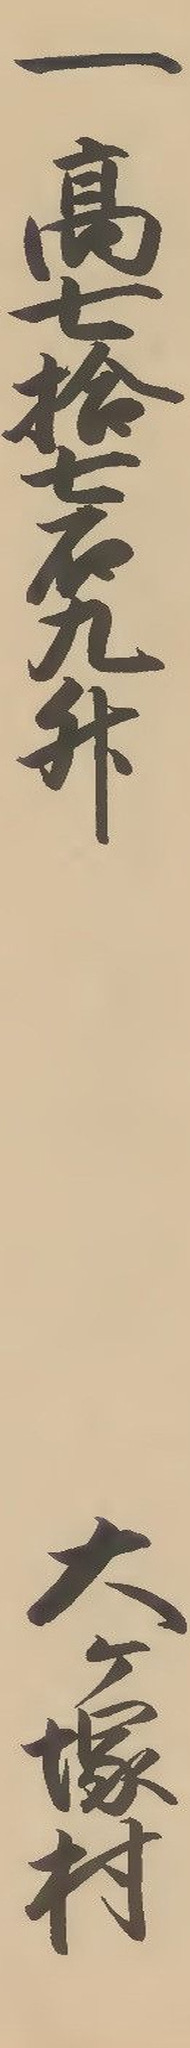一高七拾七石九升大ヶ塚村
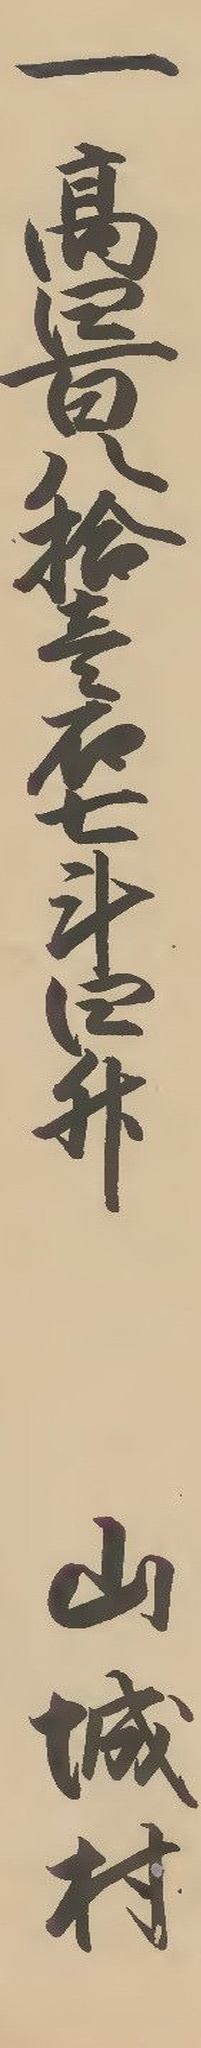一高四百八拾壱石七斗四升山城村
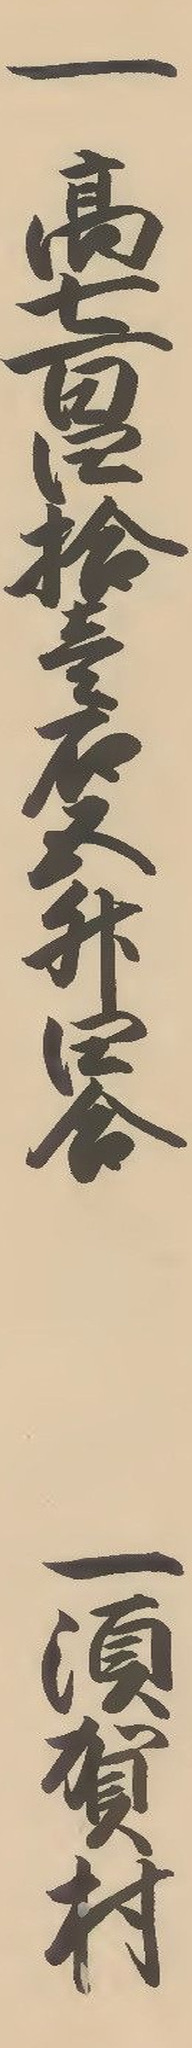一高七百四拾壱石五升四合一須賀村
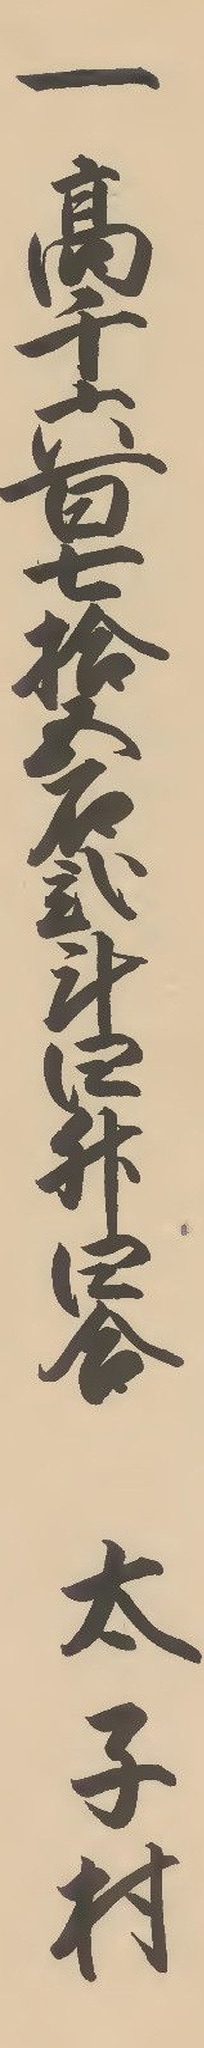一高千六百七拾五石弐斗四升四合太子村
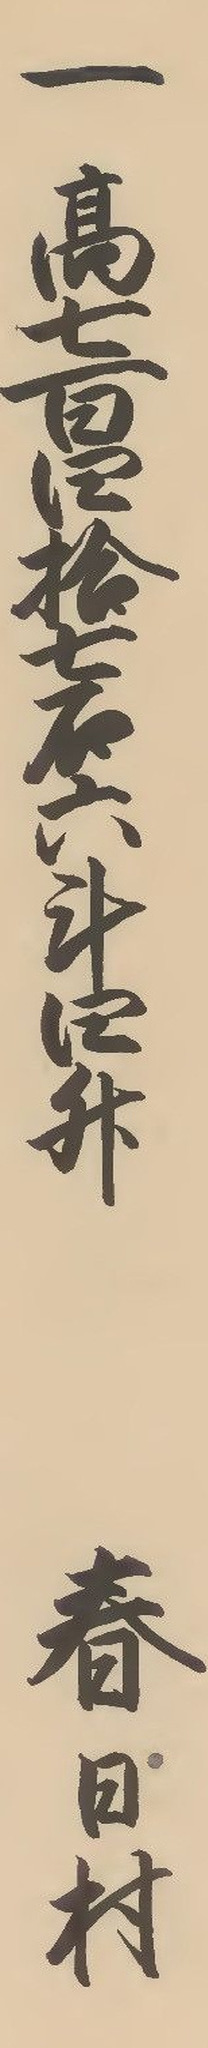一高七百四拾七石六斗四升春日村
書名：河内国郷帳
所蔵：国立公文書館 National Archives of Japan
